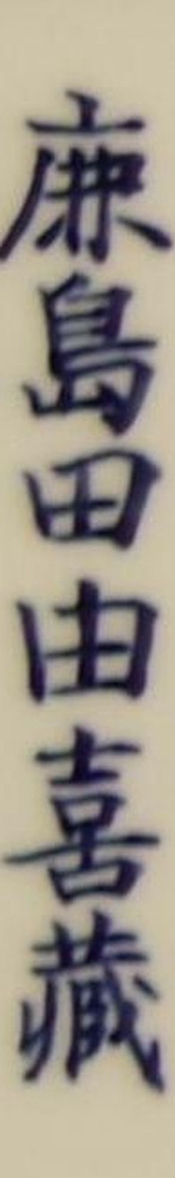鹿島田由喜蔵
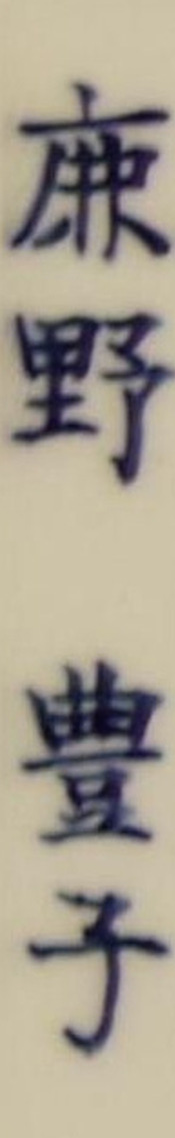鹿野豊子

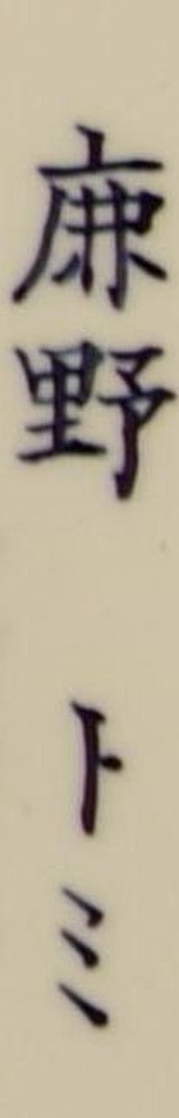鹿野トミ
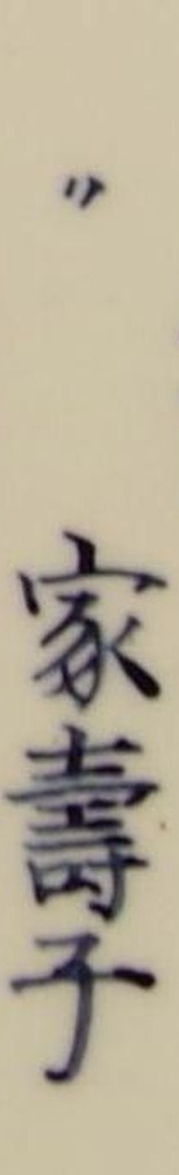家壽子
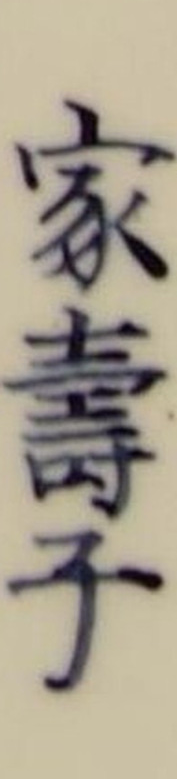家壽子
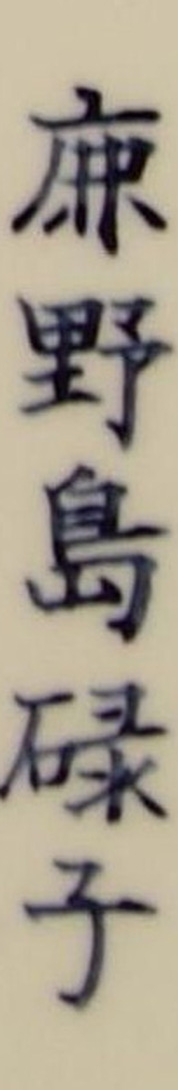鹿野島碌子
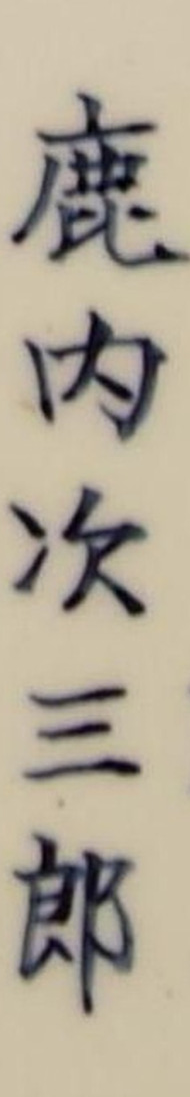鹿内次三郎
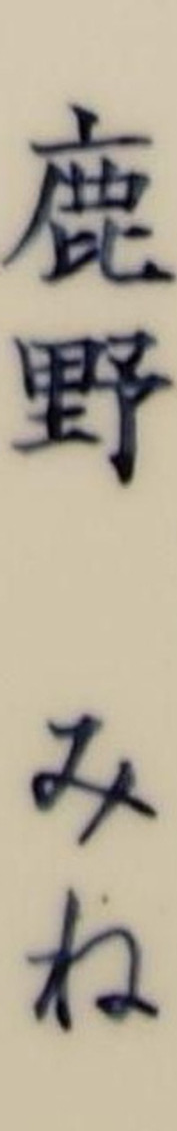鹿野みね
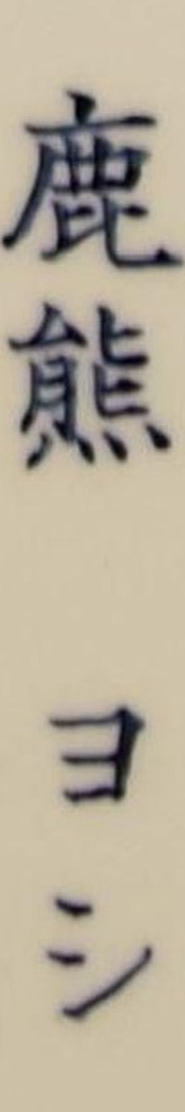鹿熊ヨシ
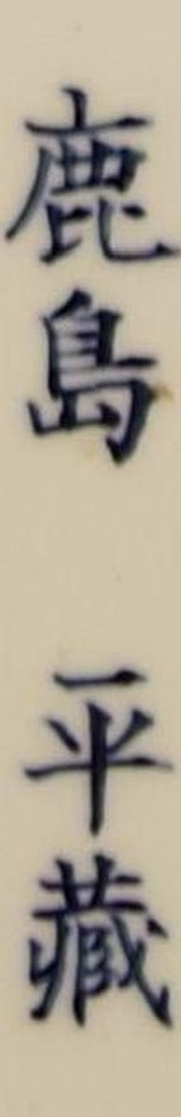鹿島平蔵
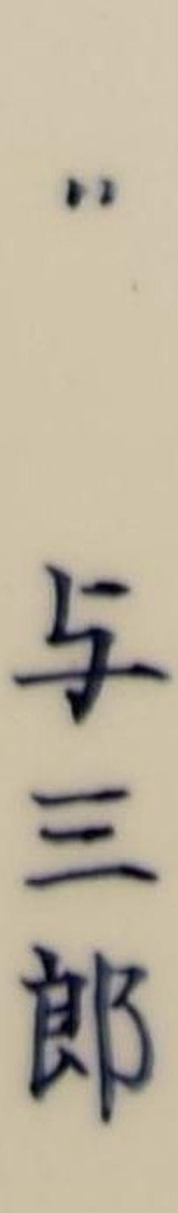与三郎
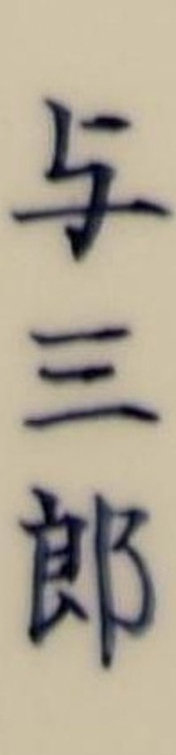与三郎
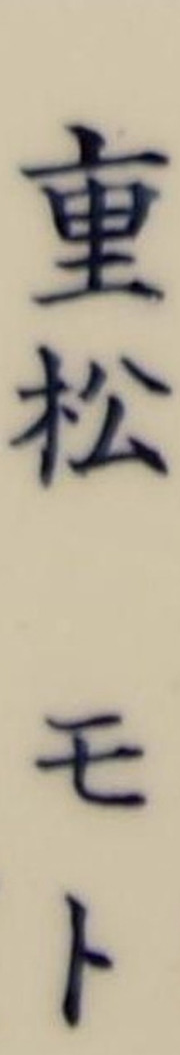重松モト
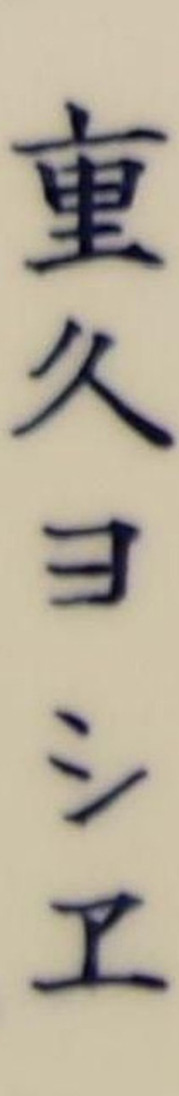重久ヨシヱ
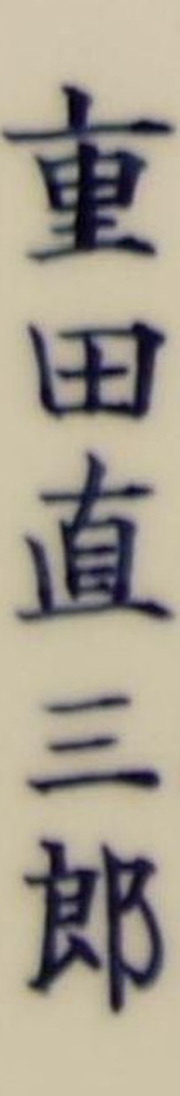重田直三郎
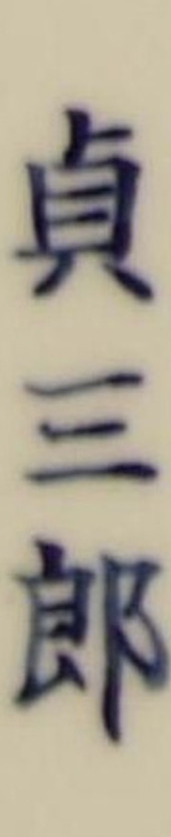貞三郎
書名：A~D
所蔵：koyasan kongobuji
